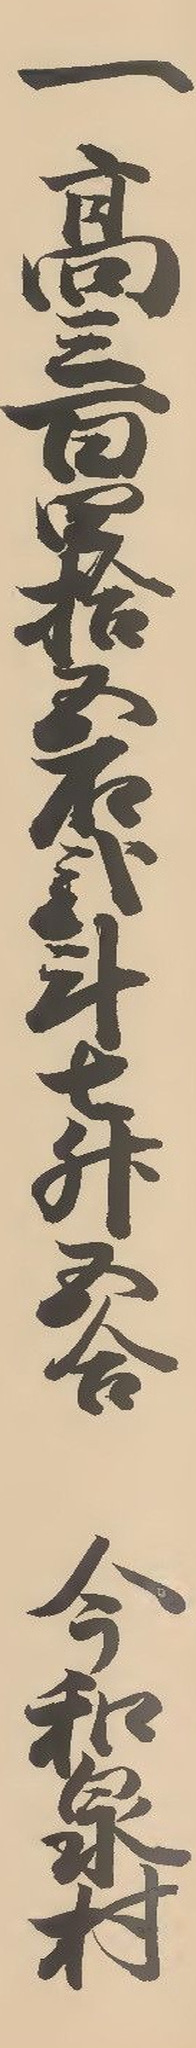一高三百四拾五石弐斗七升五合今和泉村
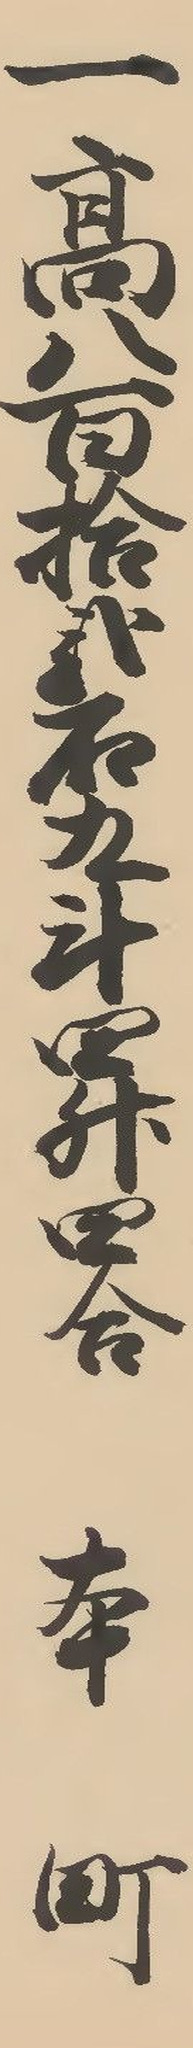一高八百拾弐石九斗四升四合本町
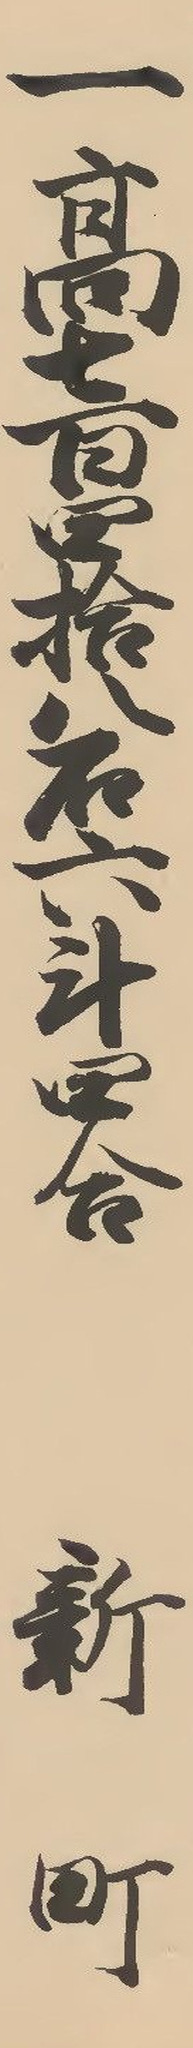一高七百四拾八石六斗四合新町
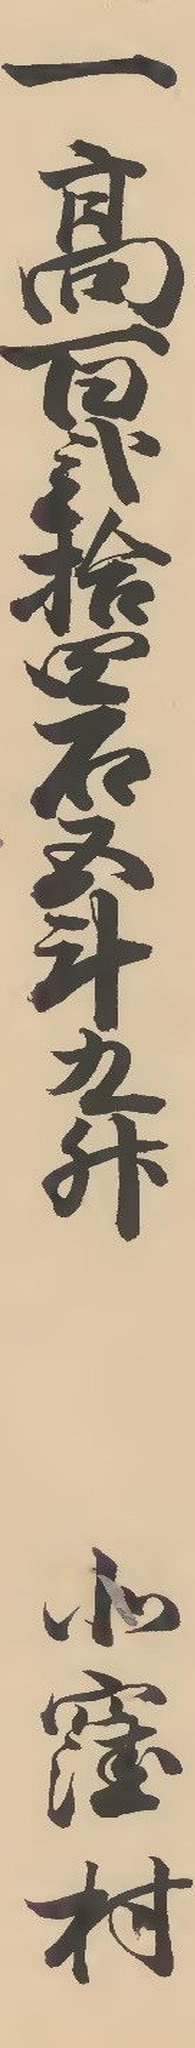一高百弐拾四石五斗九升北窪村

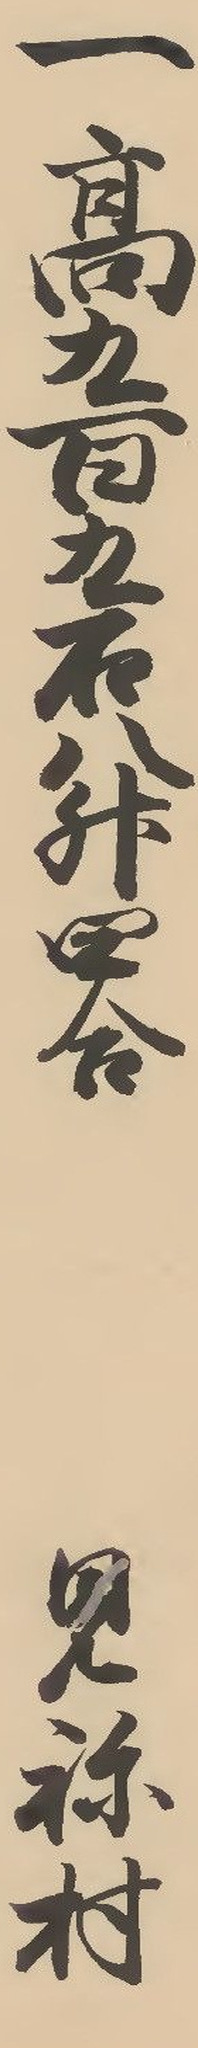一高九百九石八升四合見祢村
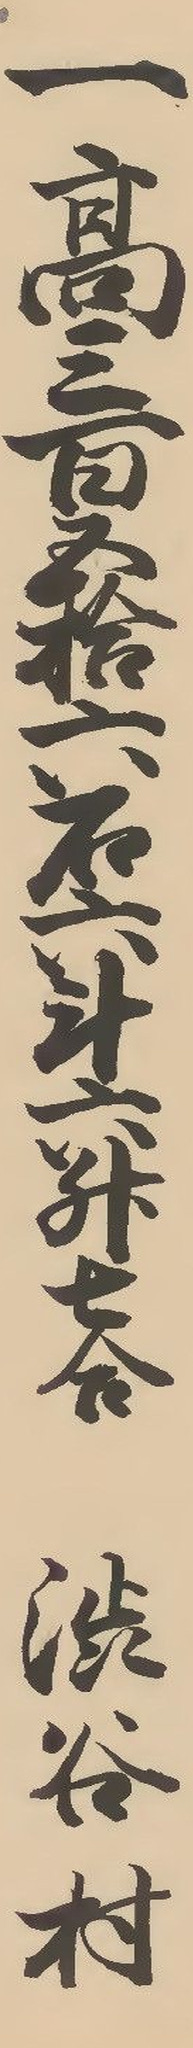一高三百五拾六石六斗六升七合渋谷村
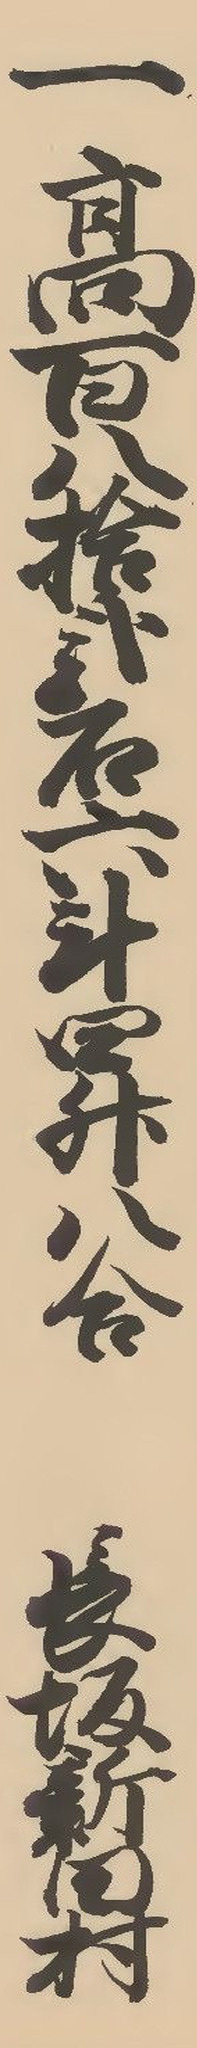一高百八拾弐石六斗四升八合長坂新田村
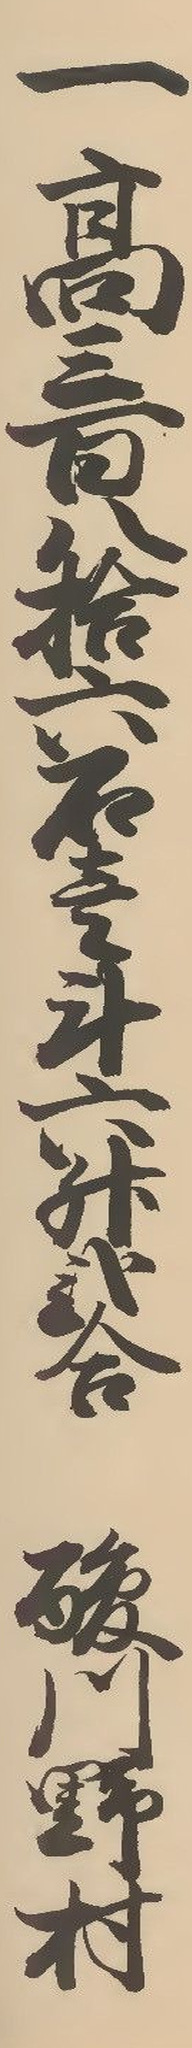一高三百八拾六石壱斗六升弐合酸川野村
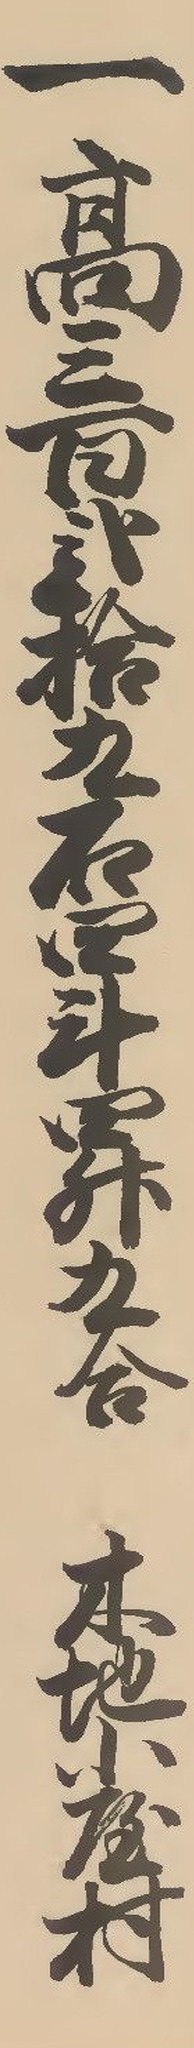一高三百弐拾九石四斗四升九合木地小屋村
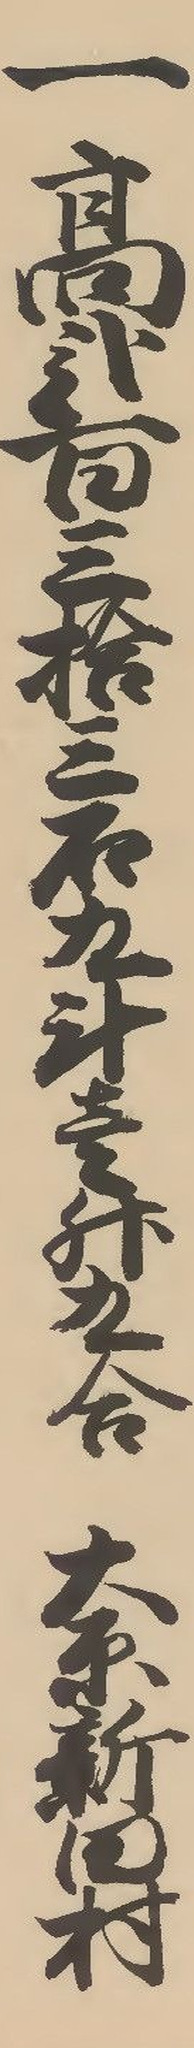一高弐百三拾三石九斗壱升九合大原新田村
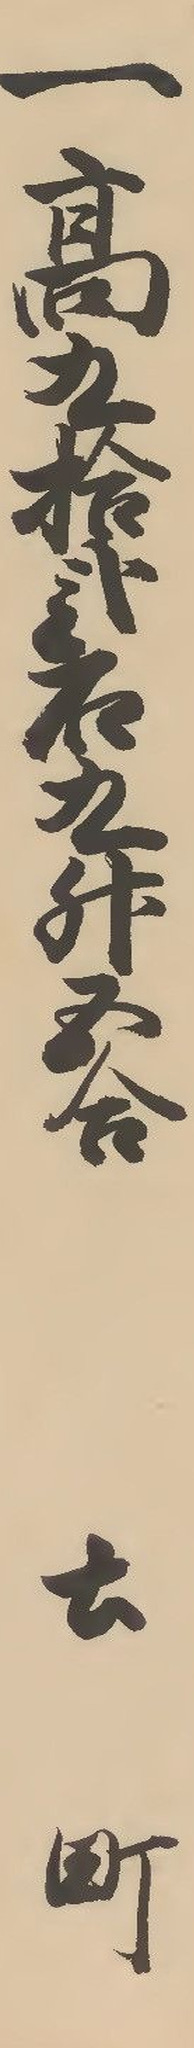一高九拾弐石九升五合土町
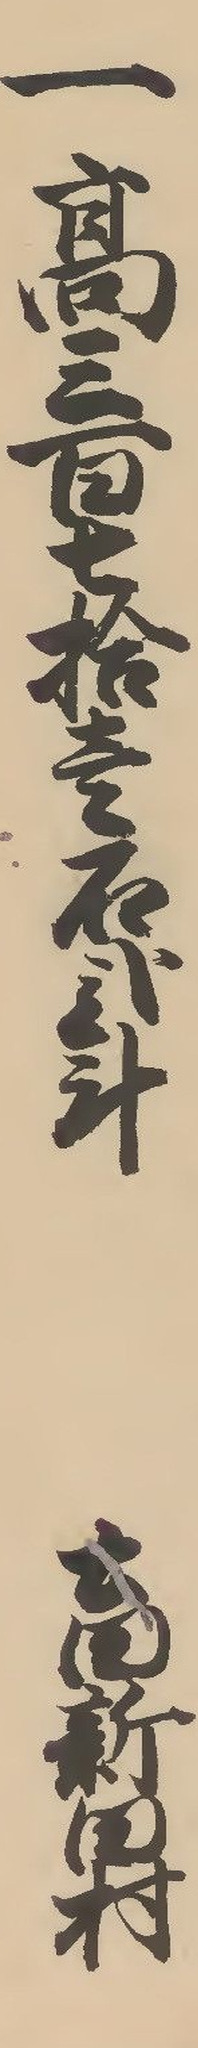一高三百七拾壱石弐斗土田新田村

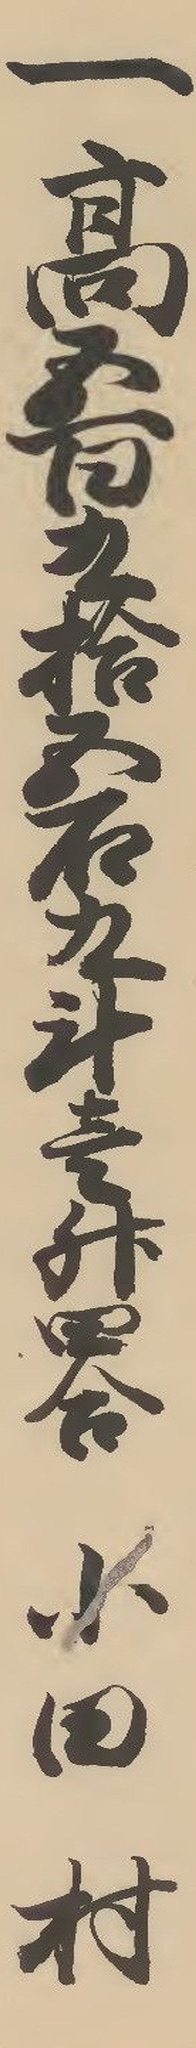一高五百九拾五石九斗壱升四合小田村
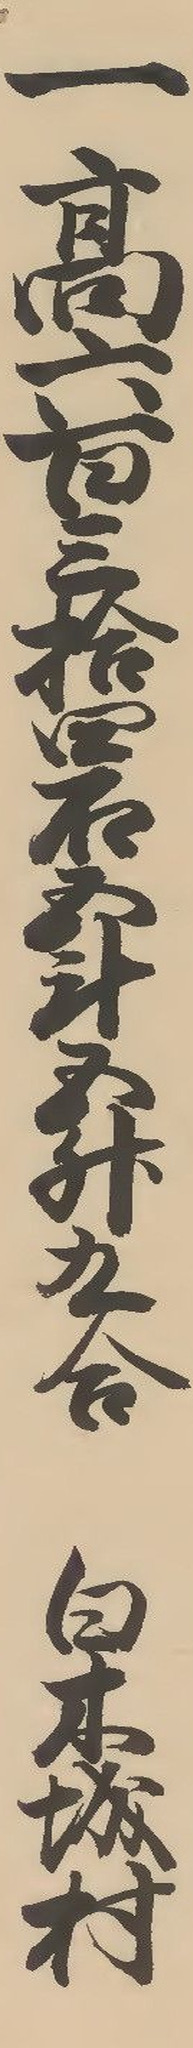一高六百三拾四石五斗五升九合白木城村
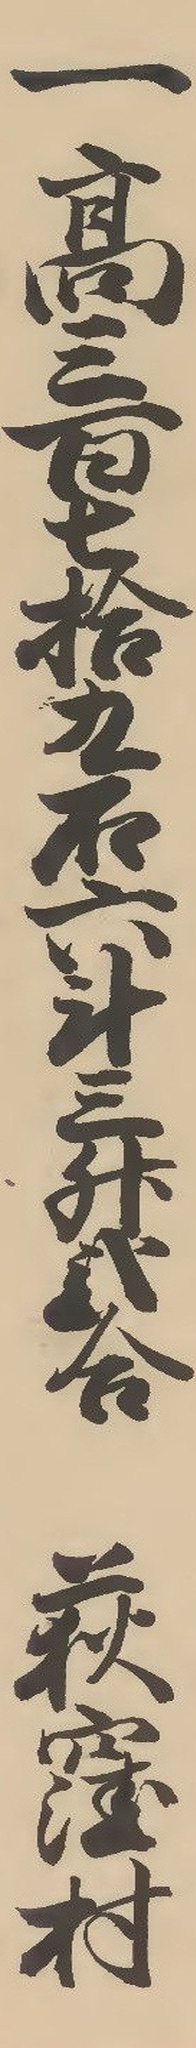一高三百七拾九石六斗三升弐合萩窪村
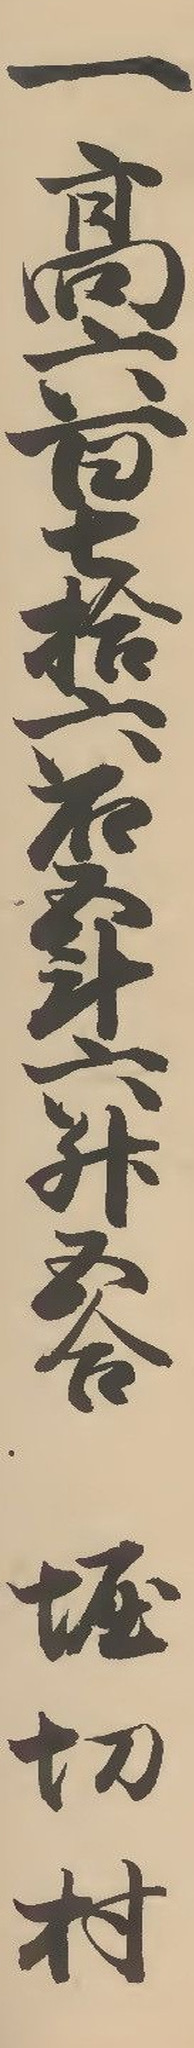一高六百七拾六石五斗六升五合堀切村
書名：陸奥国郷帳　１
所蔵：国立公文書館 National Archives of Japan
